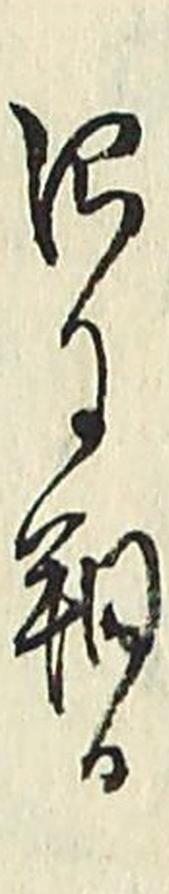四月朔日
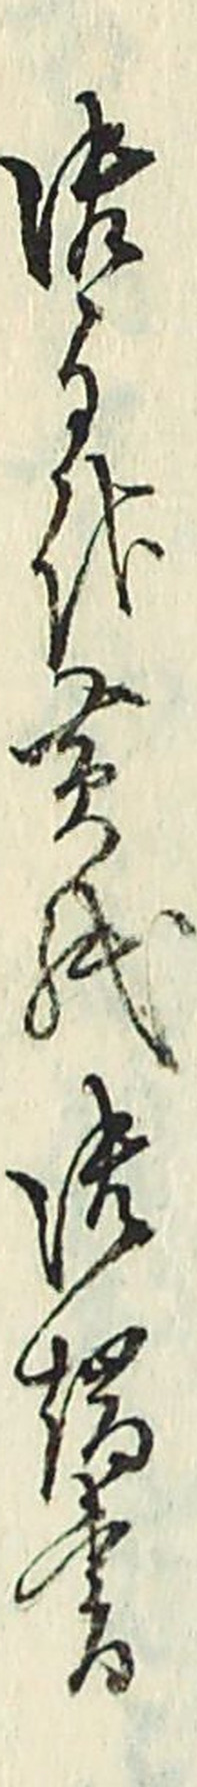御手代黄紙御端書
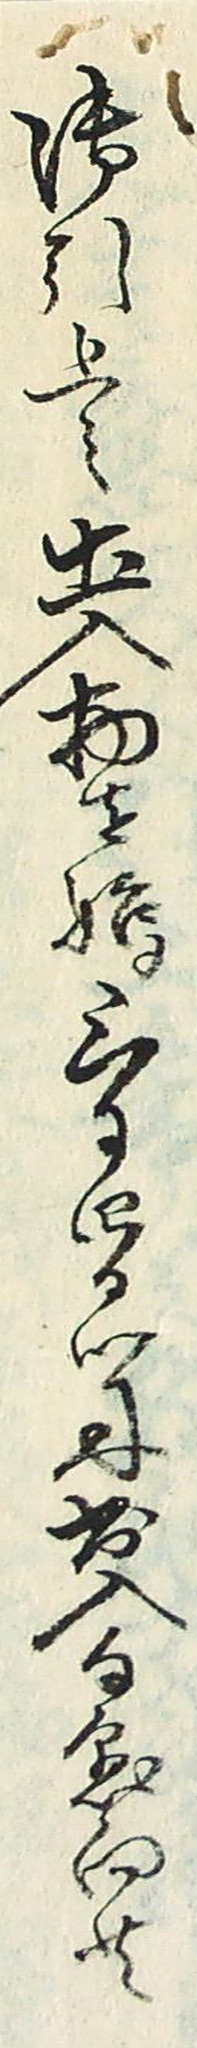御引上之出入物を始メ三月四日以来出入手懸向共
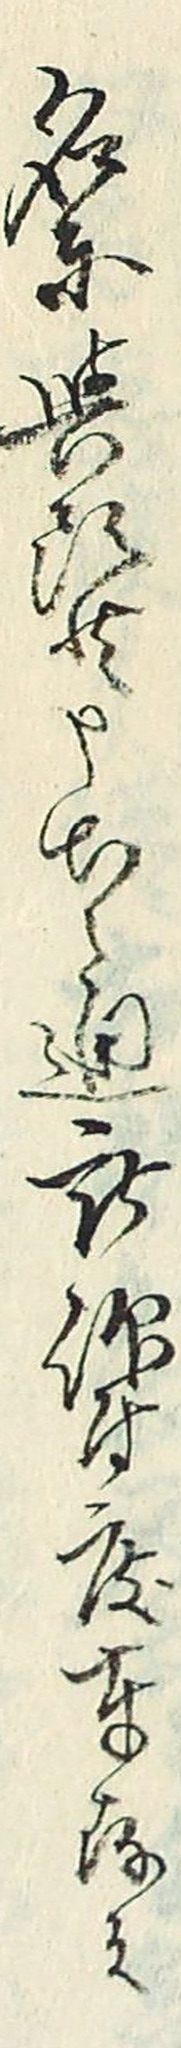名東與頭共申出之通被仰付度奉存候
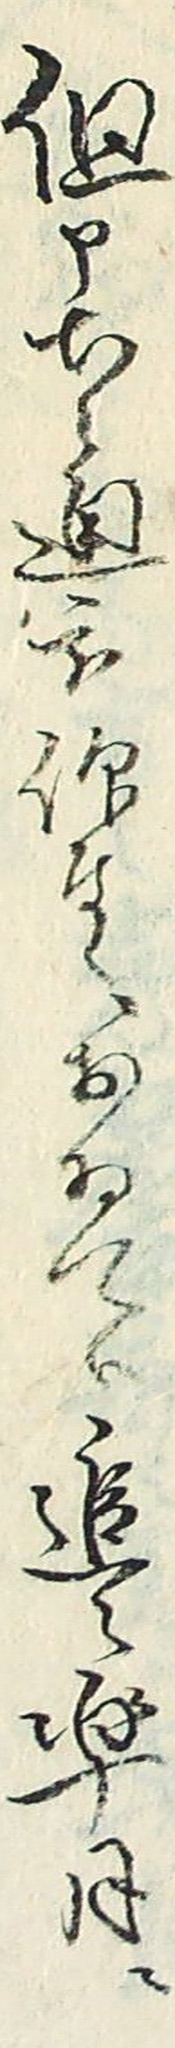但申出之通被仰付候ニおゐてハ追々皐月ニ
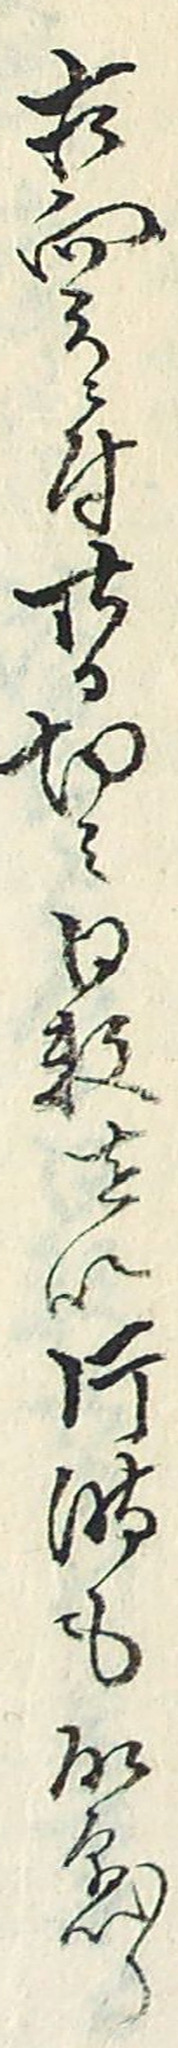相向候ニ付廿日切之日数を以片時も取懸り

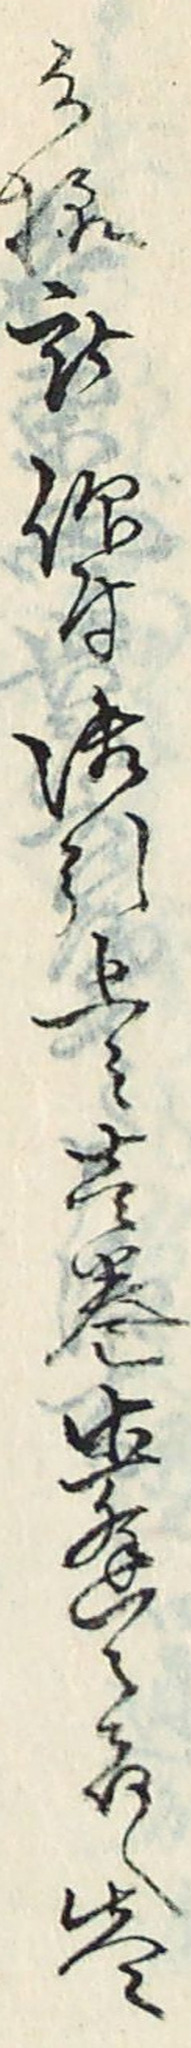候様被仰付御引上之壱巻出逢之者へ夫々
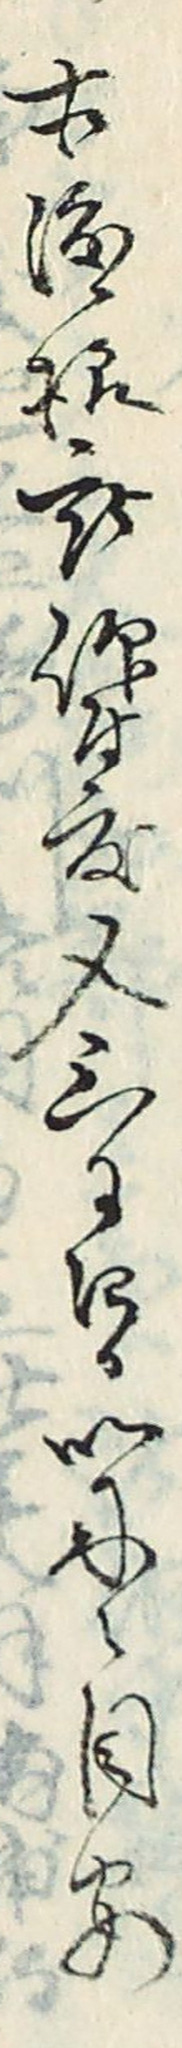相渡候様被仰付度又三月四日以来之目安
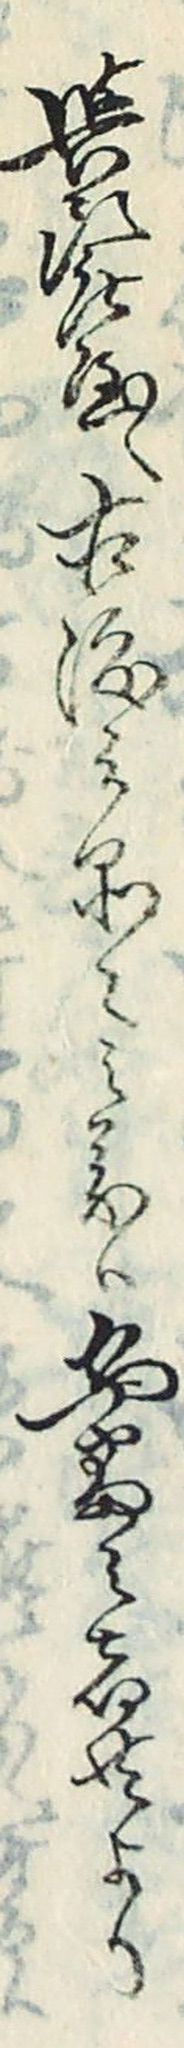與頭庄屋へ相渡候品々之義ハ當番之者共より
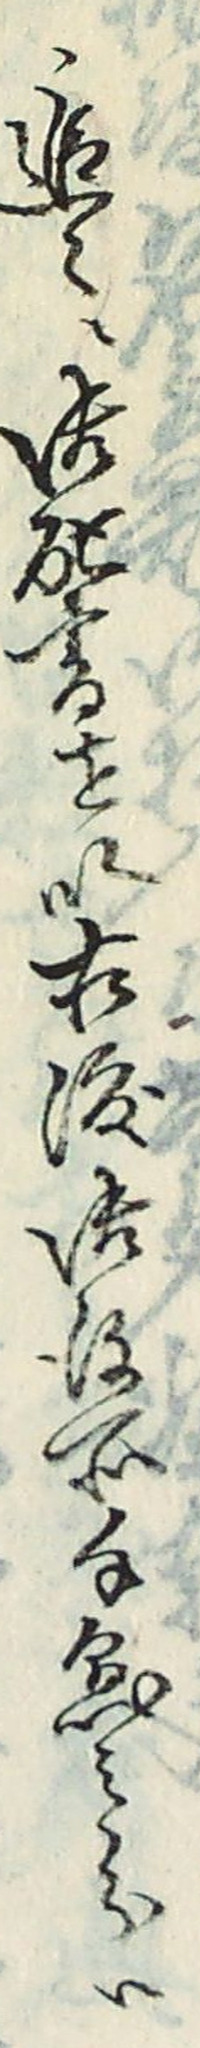追々ニ御配書を以相渡御役所手懸之分ハ
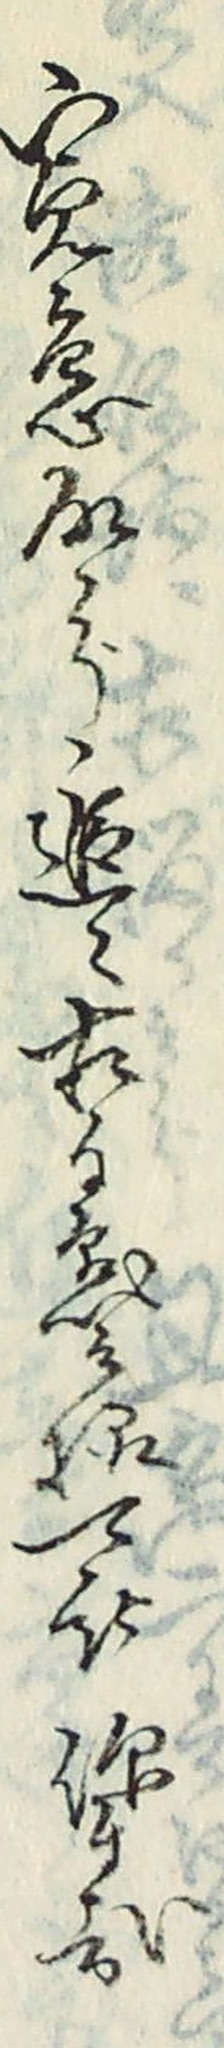寛急取分追々相手懸候様可被仰付哉

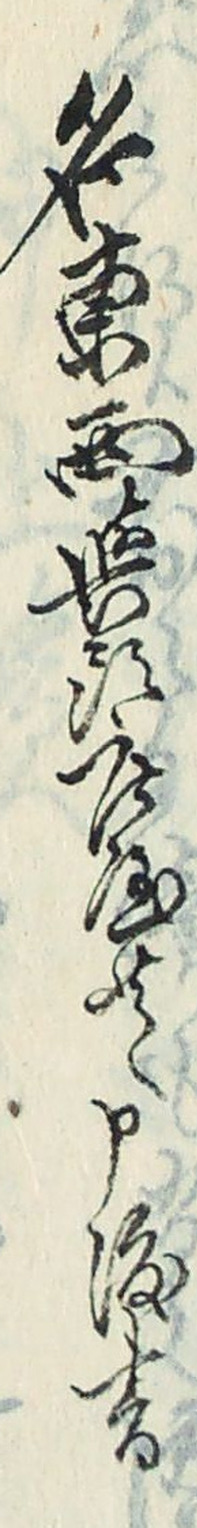名東西與頭庄屋共へ申渡書
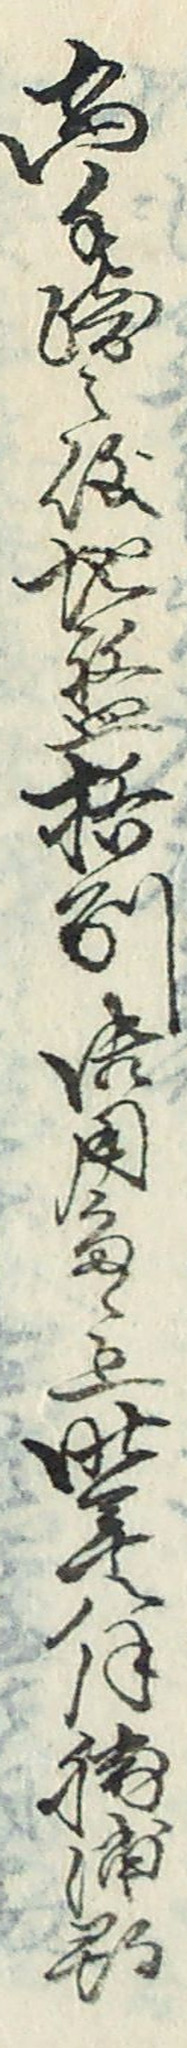當手崎之儀地盤格別御用多候上昨年八月勝浦郡
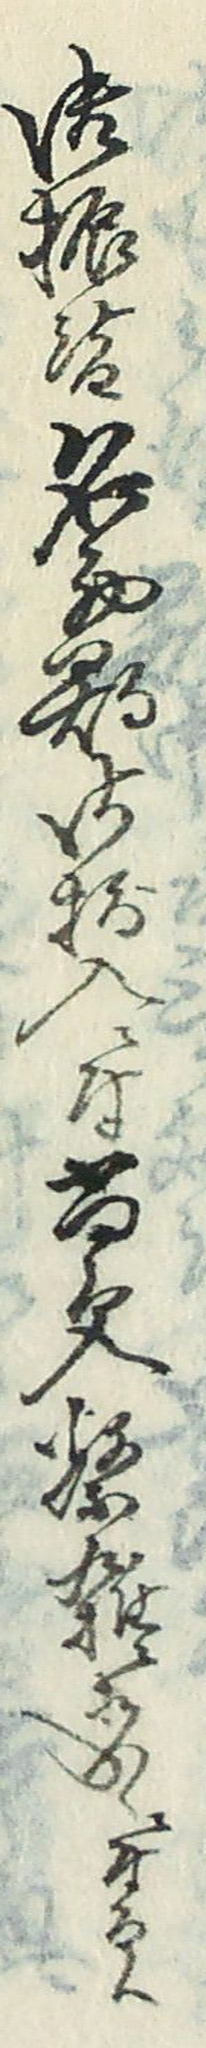御振替名西郡御指入ニ付尚更繁雑ニ相成候ニ付而ハ
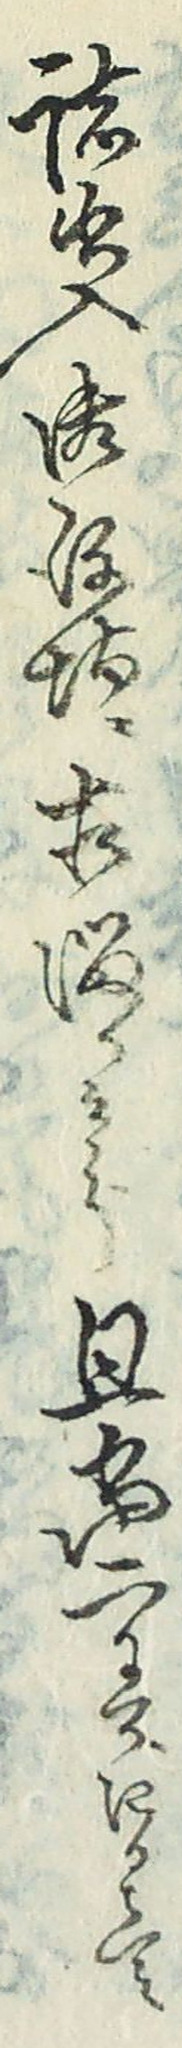諸出入御役場ニ相溜り候分且當二月廿四日迄之
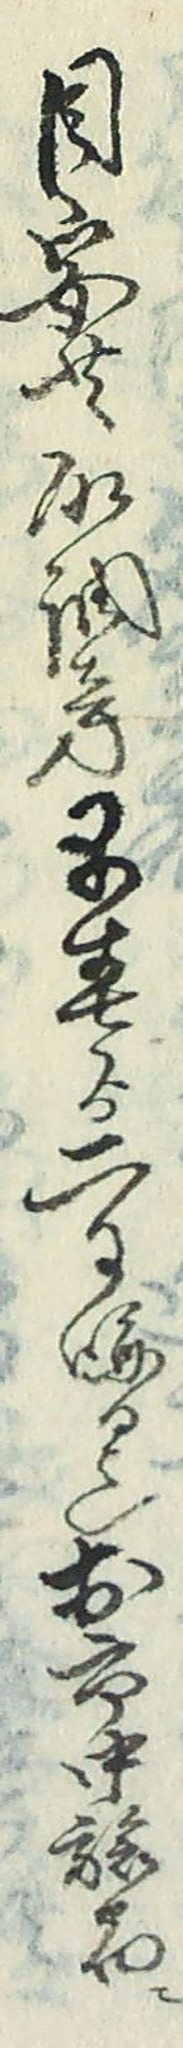目安共取調旁早春ゟ二月晦日迄於市中旅宿ニ
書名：諸御趣意書并御下知向之写
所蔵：鳴門教育大学 Naruto University of Education
